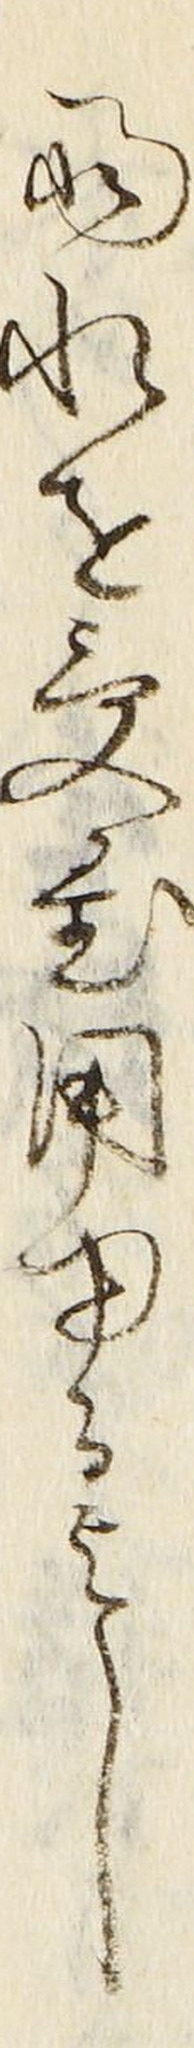雨水を受置用ゆるよし
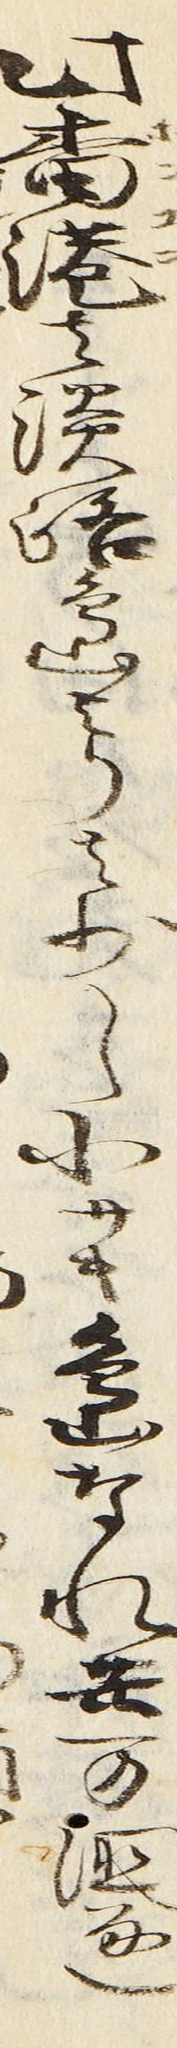此香港は談路島よりは少し小サキ島なれ共万国通
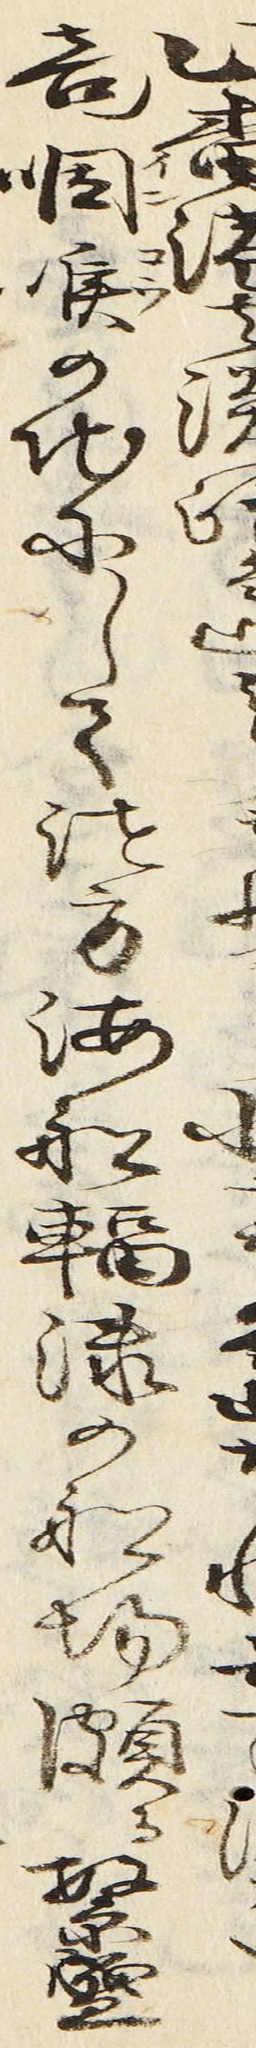商咽喉の地にして諸方海船輻湊の船場頗る繁盛
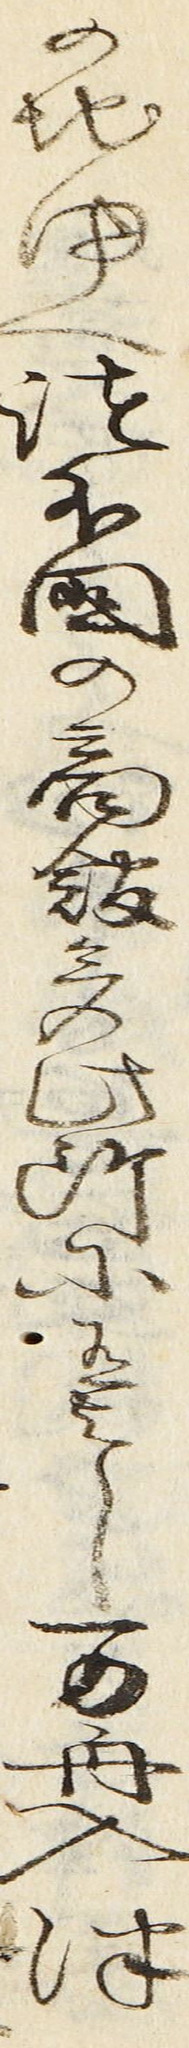の地ゆへ諸外国の商館多此所に有よし万舟入津
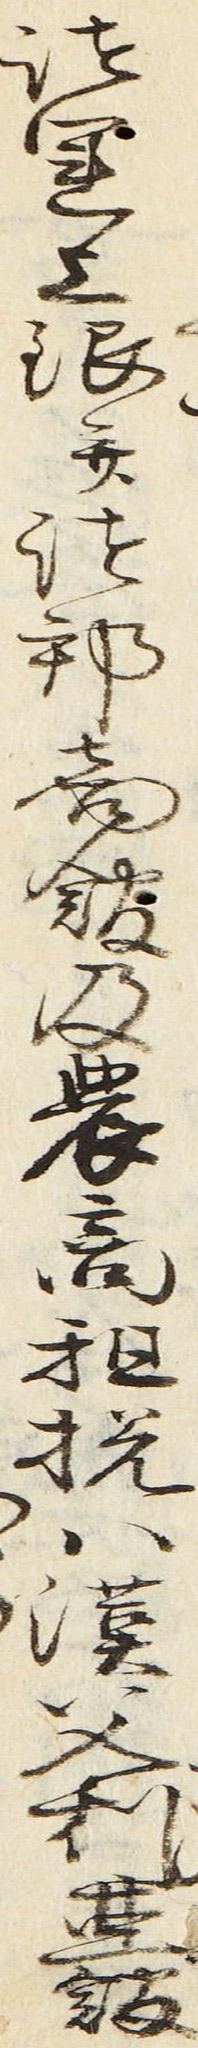諸運上銀并諸邦商館及農商租税ハ漢父利亜館
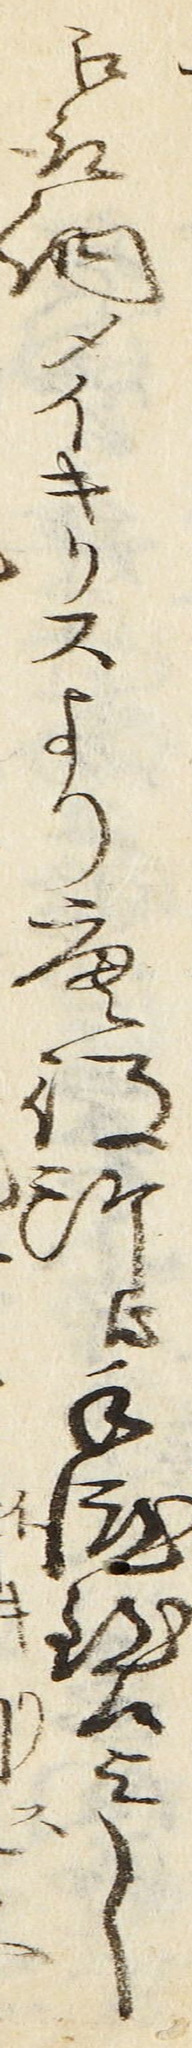え取納メイキリスより唐役所え手渡致候よし
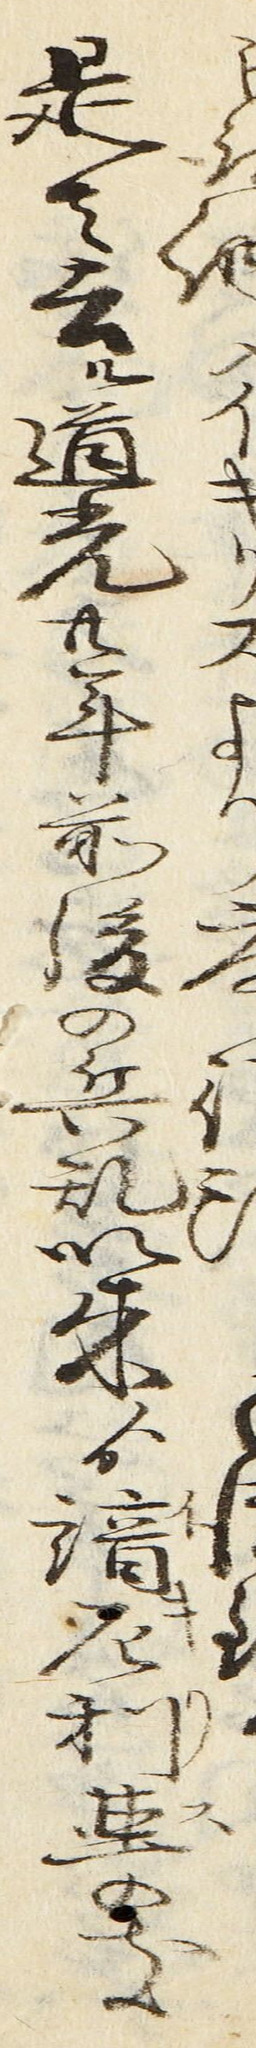是は去ル道光廿年前後の兵乱以来ゟ諳厄利亜の支
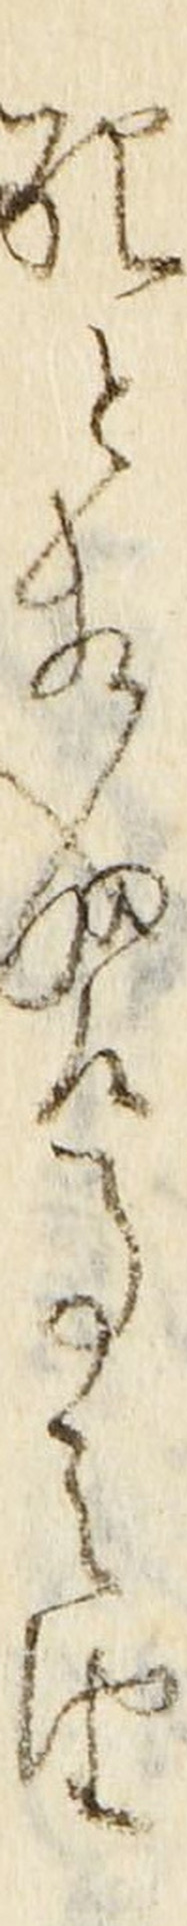配と相成ル事之由
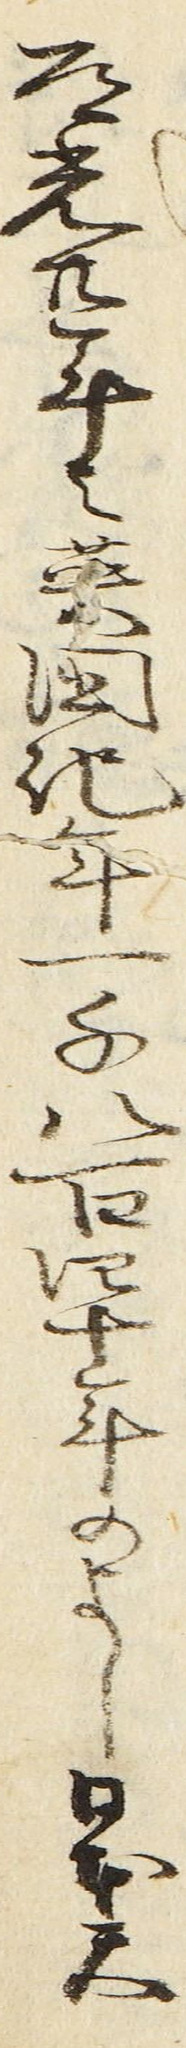道光廿年は英国紀年一千八百四十年のよし日本天

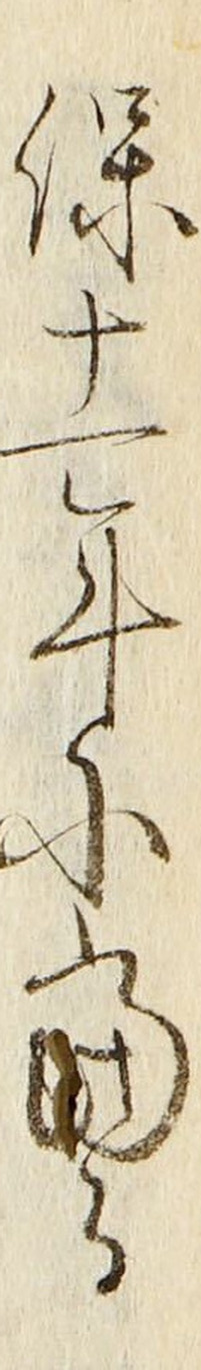保十一年に当る
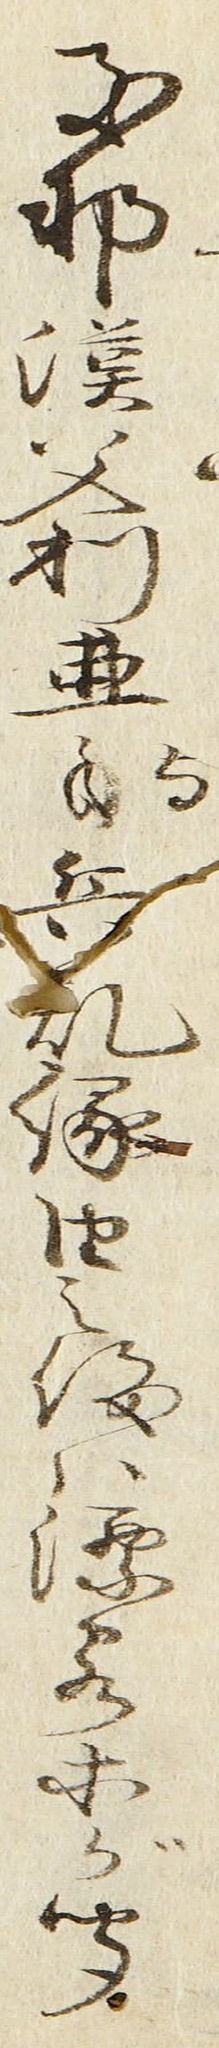支那漠父利亜与兵乱縁由之儀ハ漂客等が聞
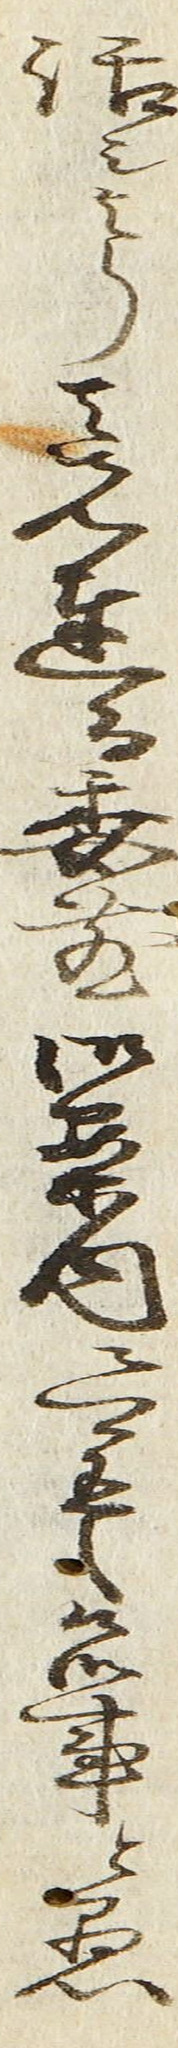話シよりは先達而委敷御案内ニ可有之候事と愚
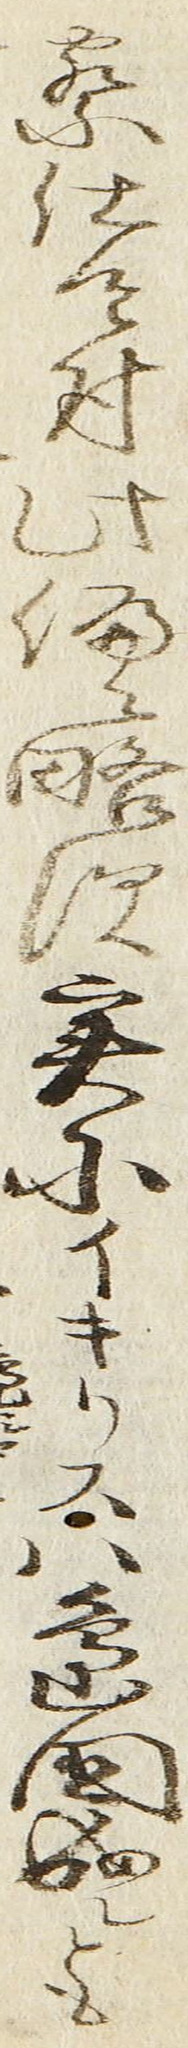察仕候ニ付此偏ニ略す実にイキリスハ島国成レとも
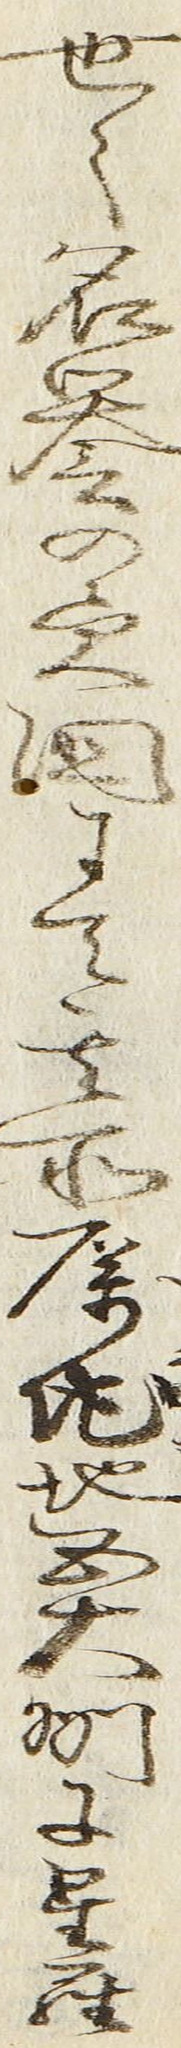世之名誉の美国にて其所属地島地五大州に星羅
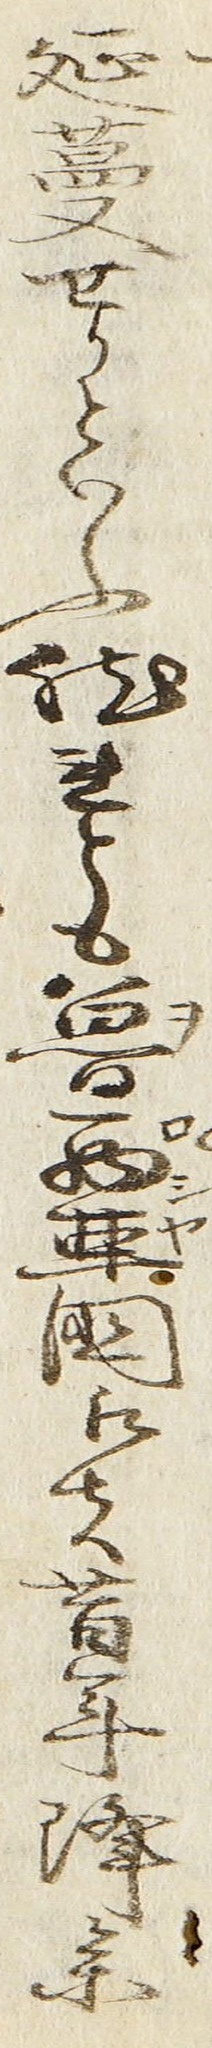延蔓せりといふ然れとも魯西亜国えは昔年降参
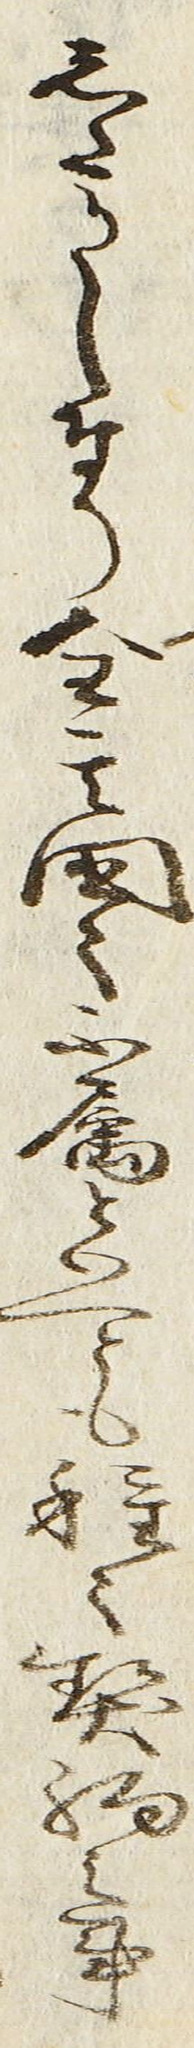したりしなり全其国之不属といへとも種々契約之事
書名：亜墨利加漂流記聞
